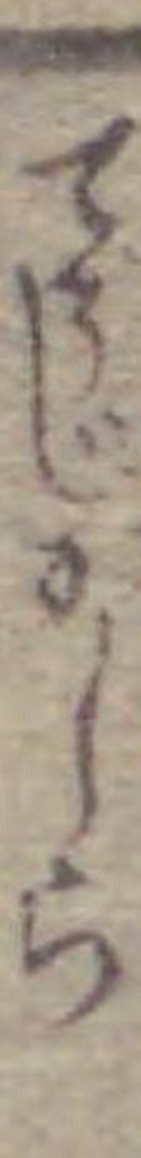てうじかしら
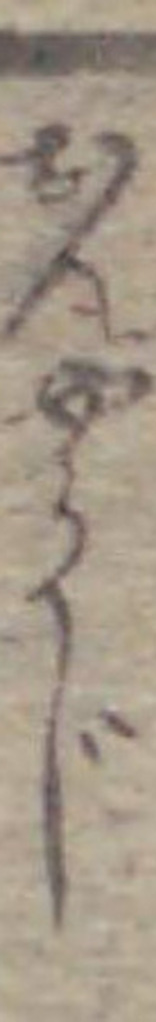おんやうじ
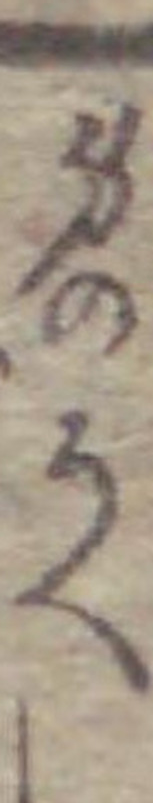身のうへ
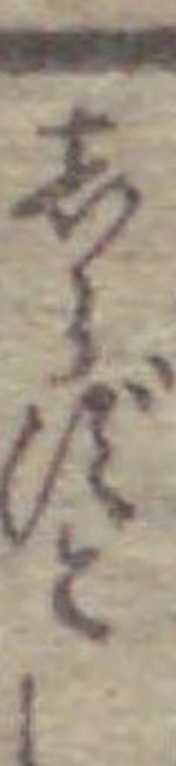しらずと

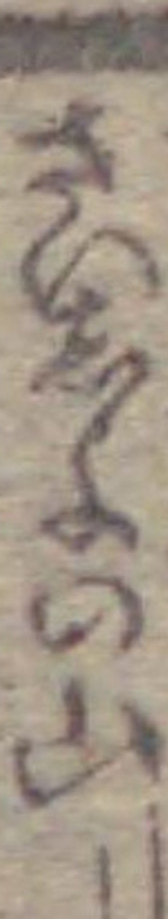さいしよの山
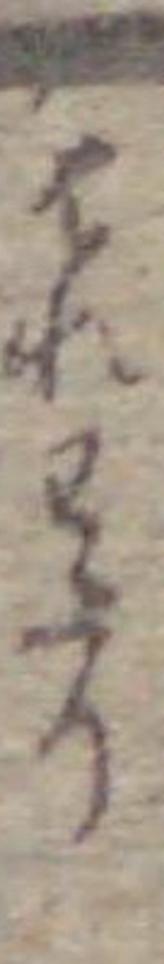はれわたり
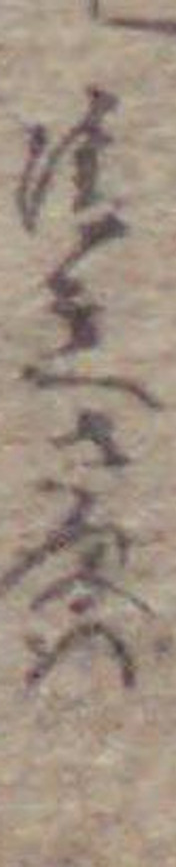清兵へさまは
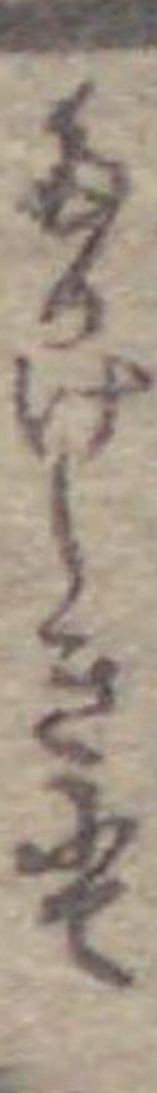たかけしきにて
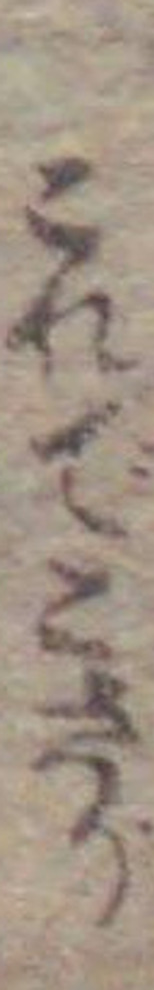これでこさり
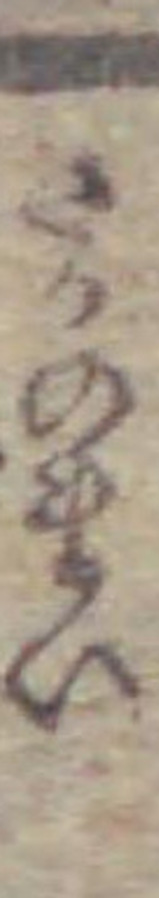たかのまい
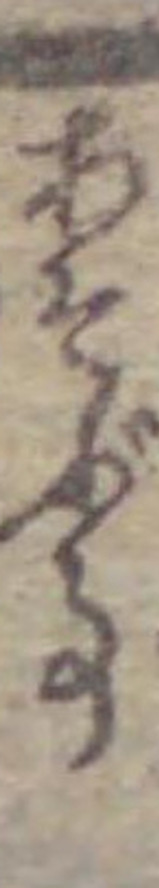あそぶ事
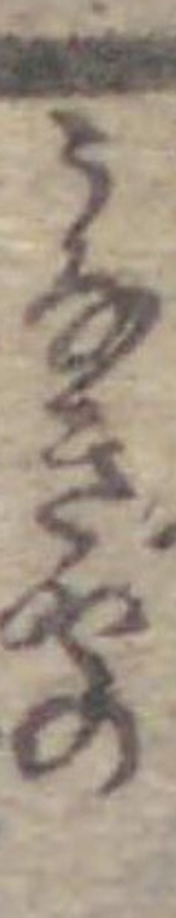うなきやの
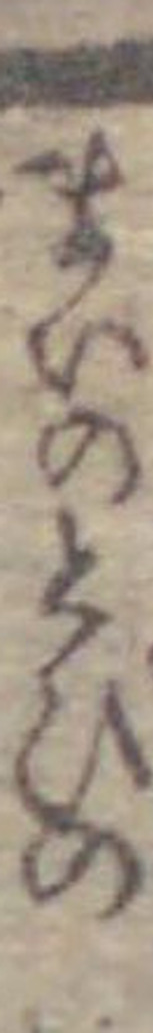まいのとひの
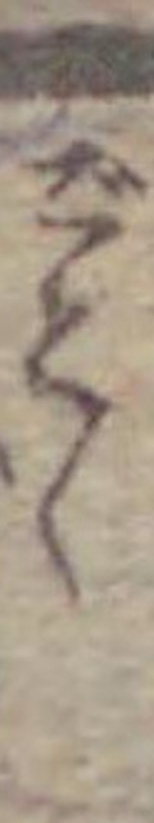ごとく
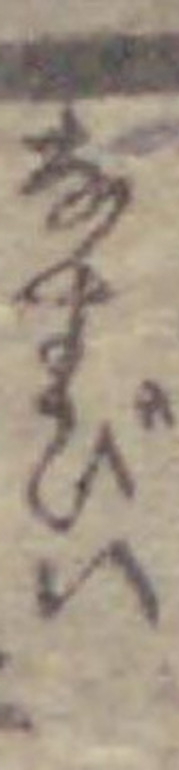なすびは
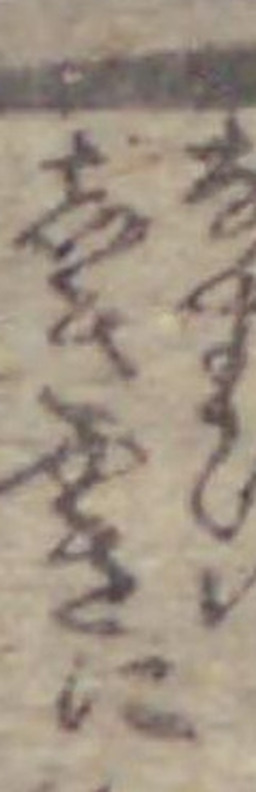しきやきに
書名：見通占 : 3巻
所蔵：国立国会図書館 National Diet Library, JAPAN
